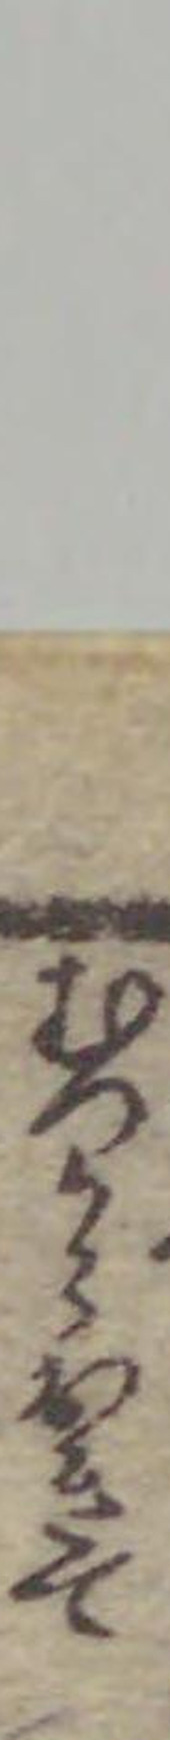むつからおきて
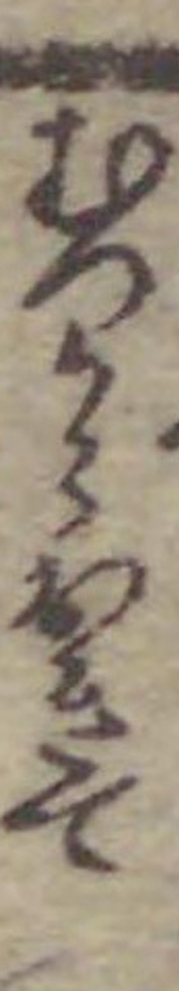むつからおきて
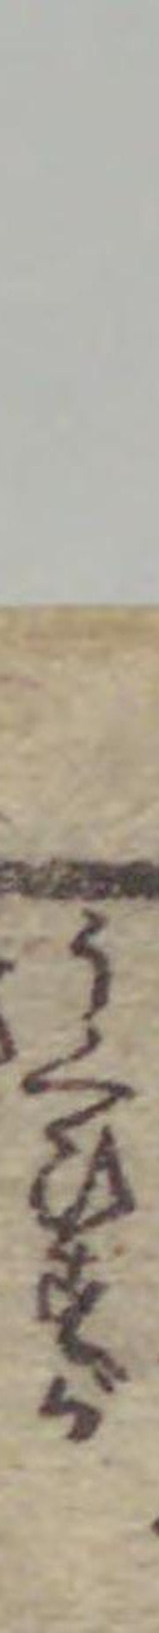うくひすが
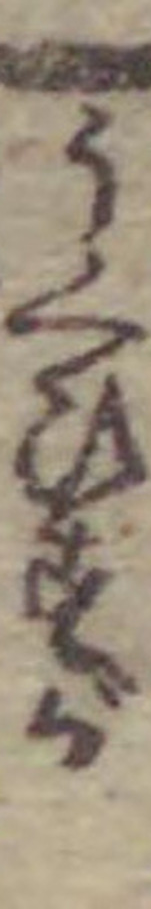うくひすが
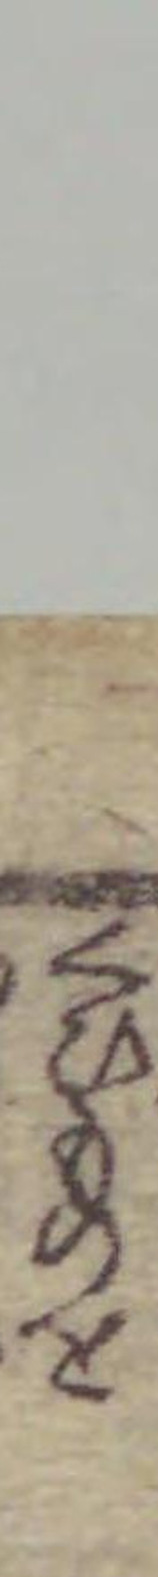くひものを
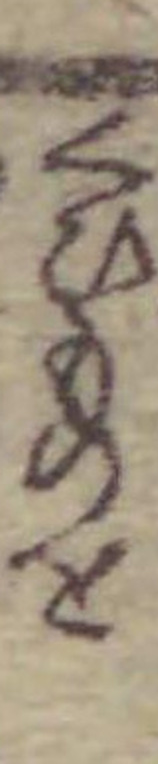くひものを
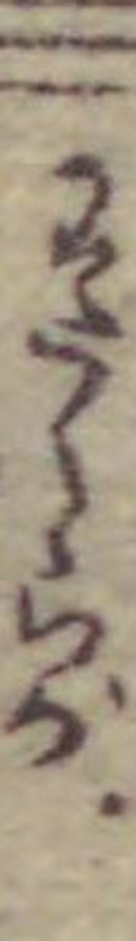わたしらが
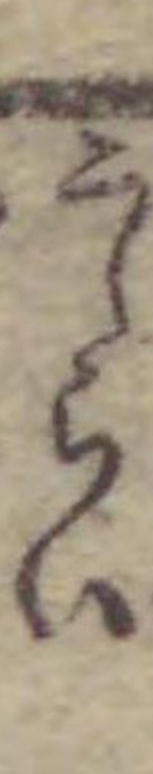こしらい
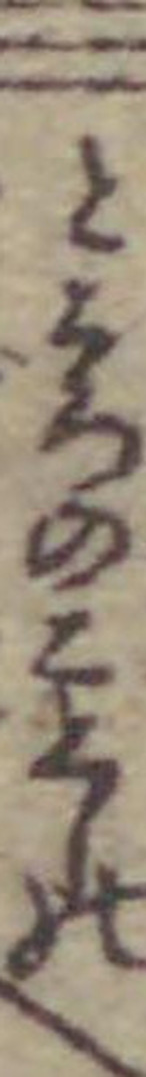ところのミその
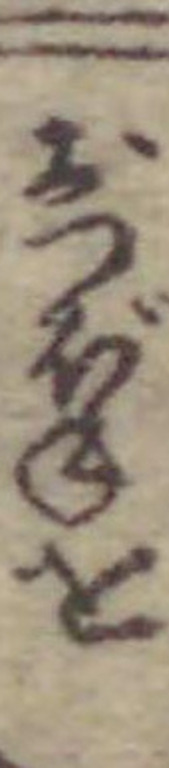おつぼねを
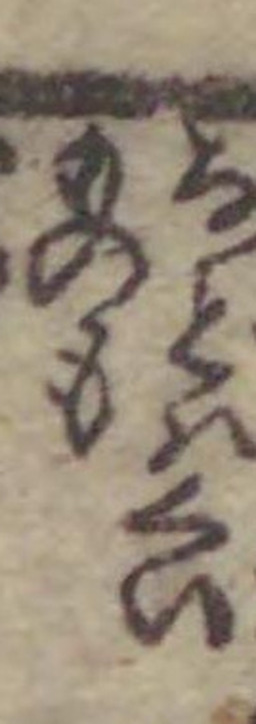ものも
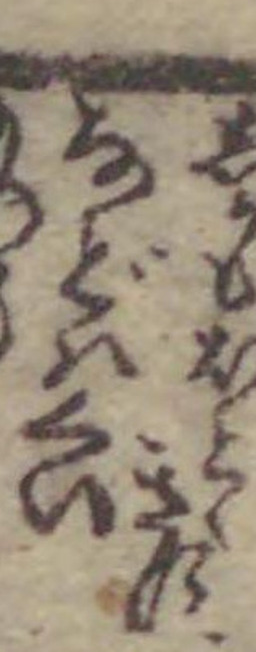などハくい
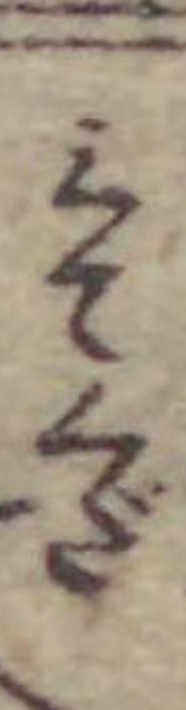ミてくだ
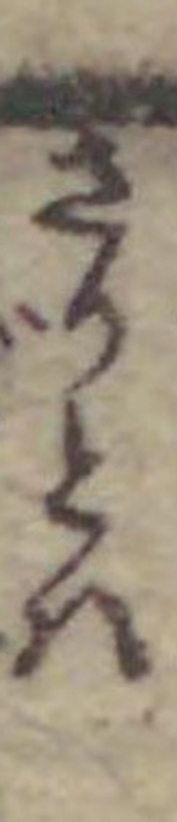さりとハ
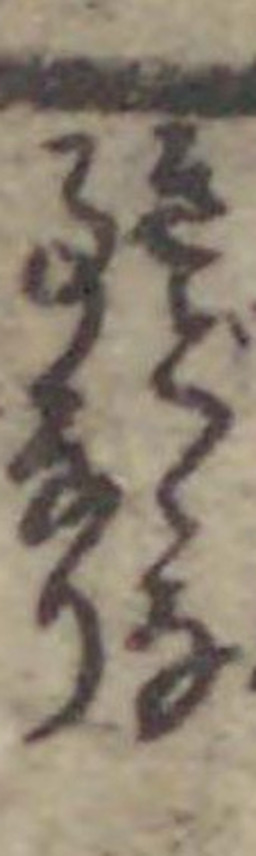事なり
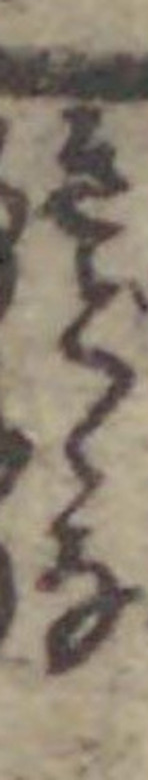きどくな
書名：烏行水諺草 3巻
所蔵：国立国会図書館 National Diet Library, JAPAN
